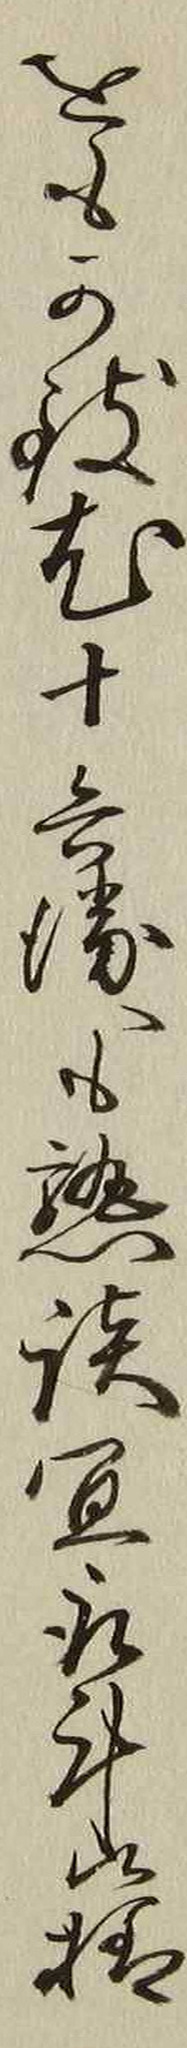をも可致尤十兵衛へも熟談宜取斗候様
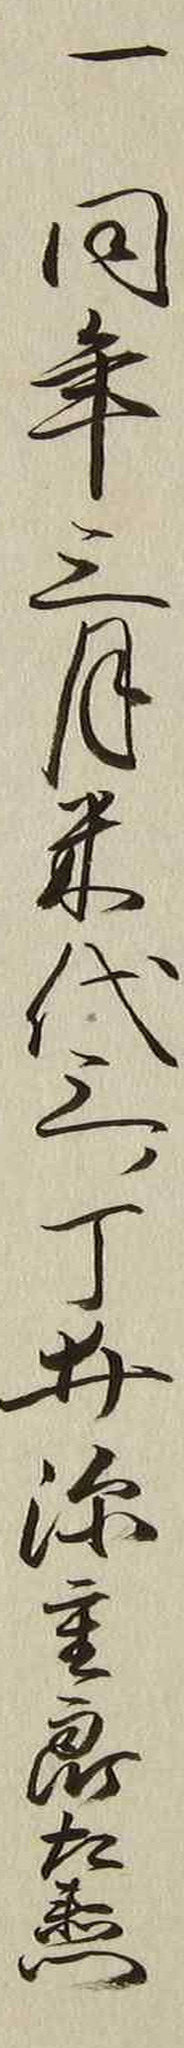一同年三月米代三ノ丁井深重郎左衛門
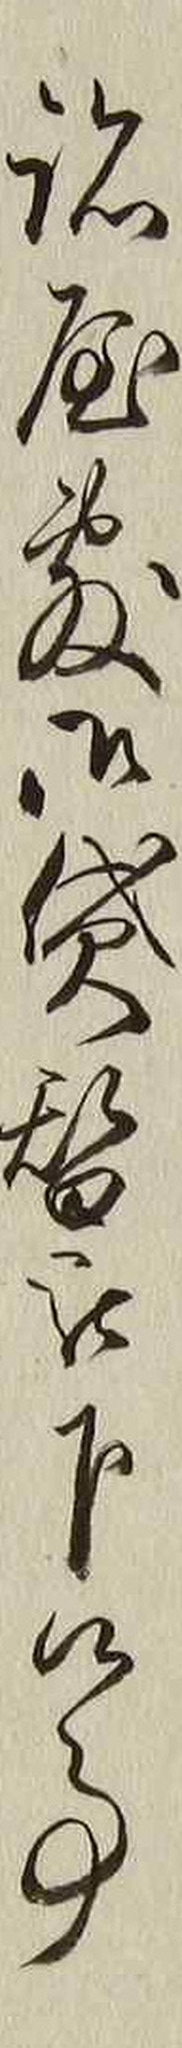跡屋敷御貸替被下候事
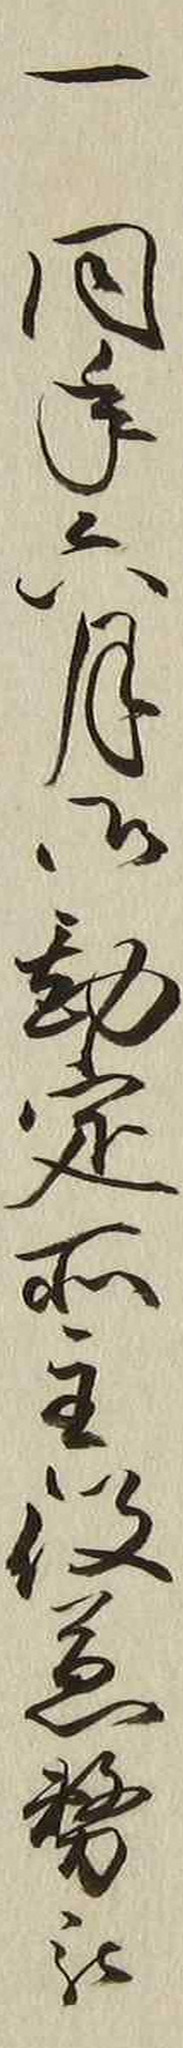一同年六月御勘定所主役兼務被
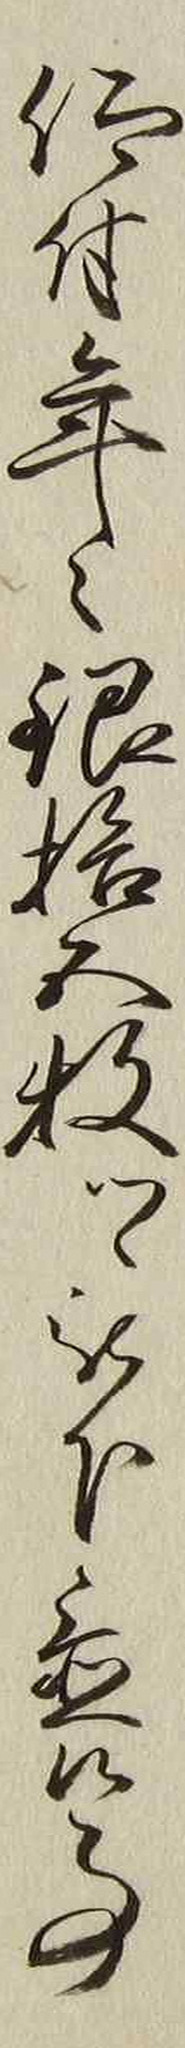仰付年々銀拾五枚ツヽ被下置候事
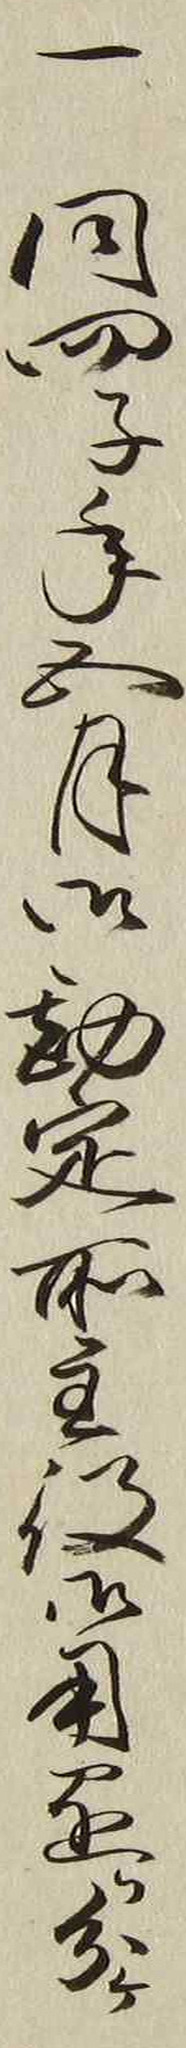一同四子年五月御勘定所主役御用懸り分ケ
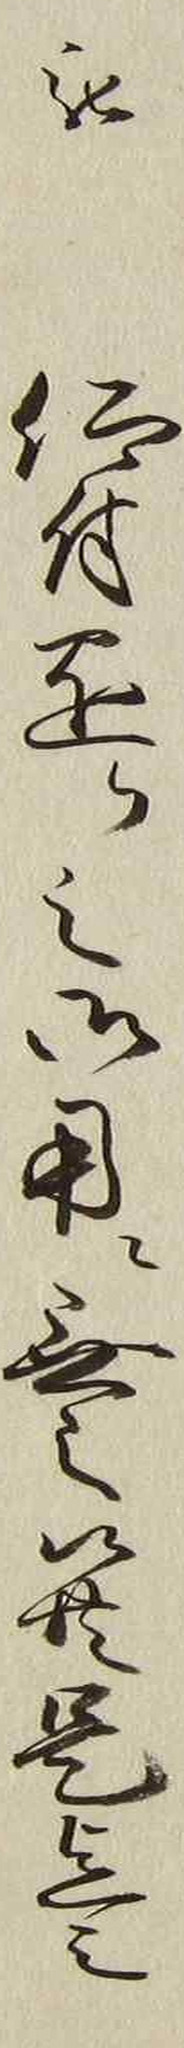被仰付懸り之御用ニ無之候共是迄之
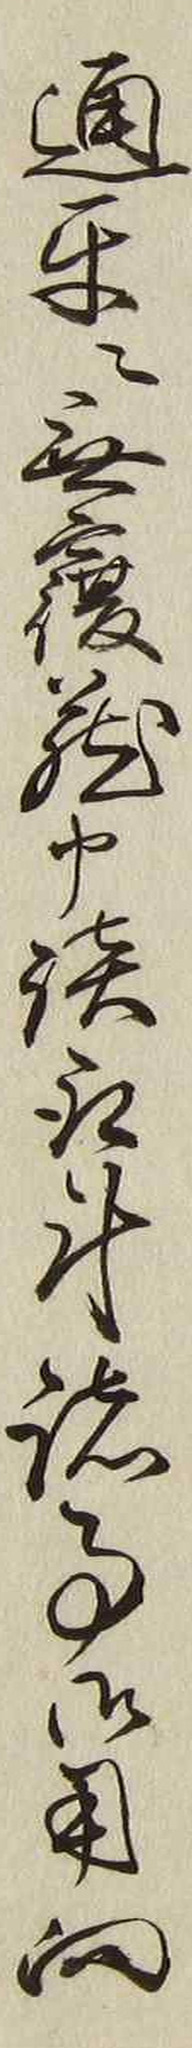通互ニ無覆蔵申談取斗諸事御用向
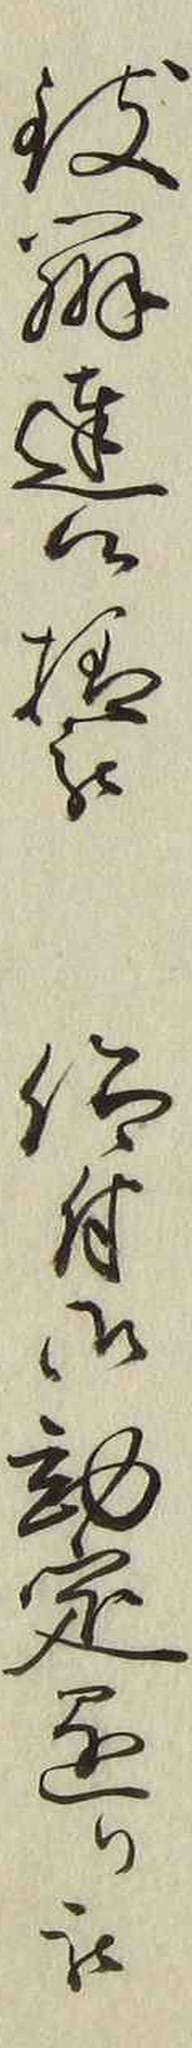致弁達候様被仰付御勘定懸り被
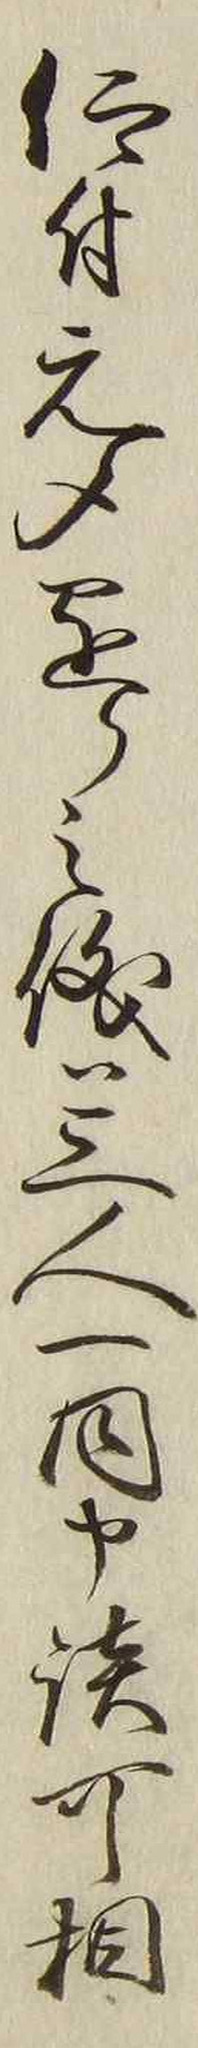仰付元〆懸り之儀ハ三人一同申談可相

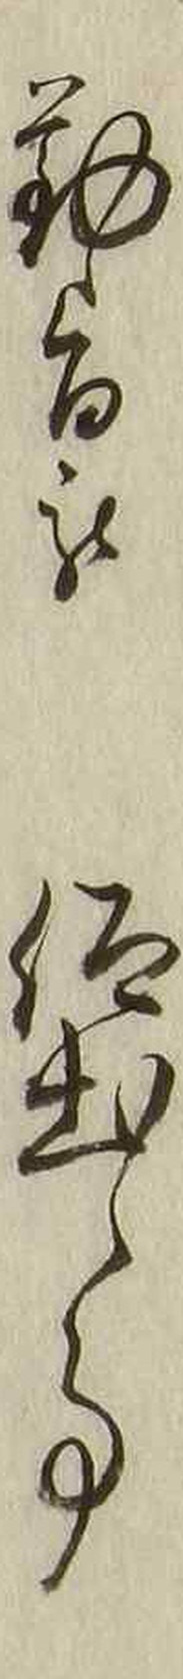勤旨被仰出候事
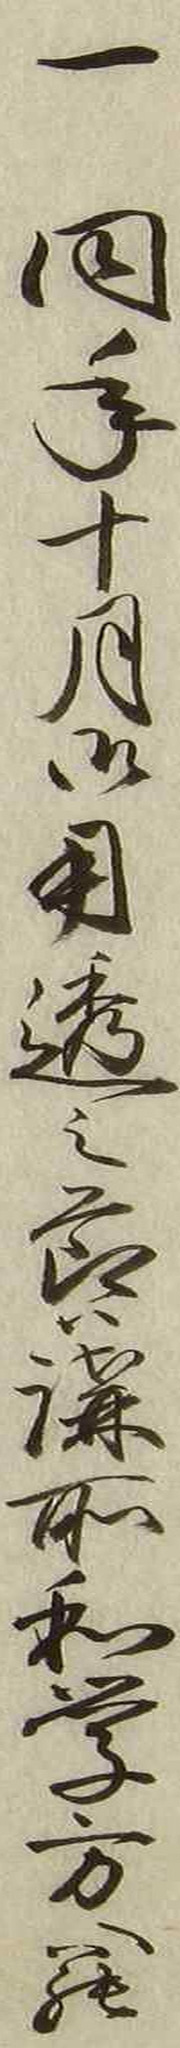一同年十月御用透之節ハ講所和学方へ罷
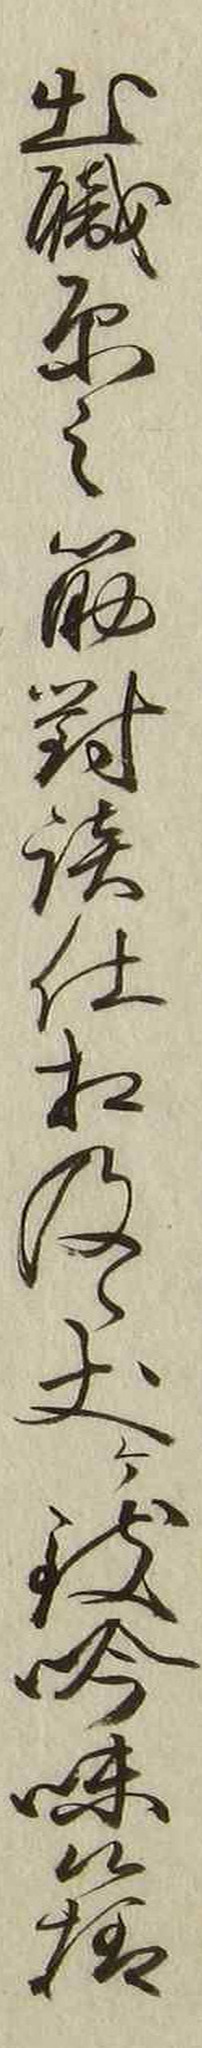出職原之筋対談仕相及候丈ケ致吟味侯様
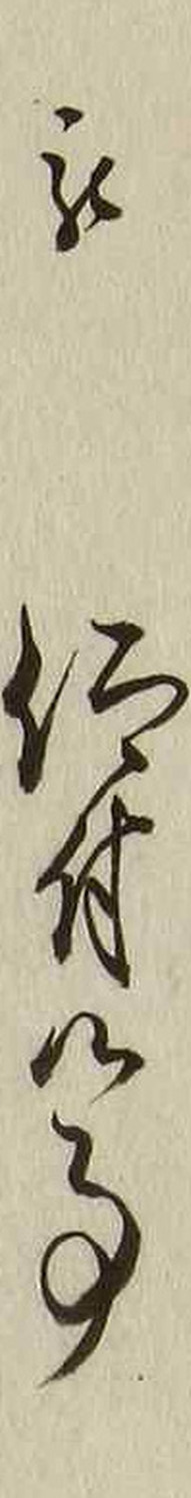被仰付候事
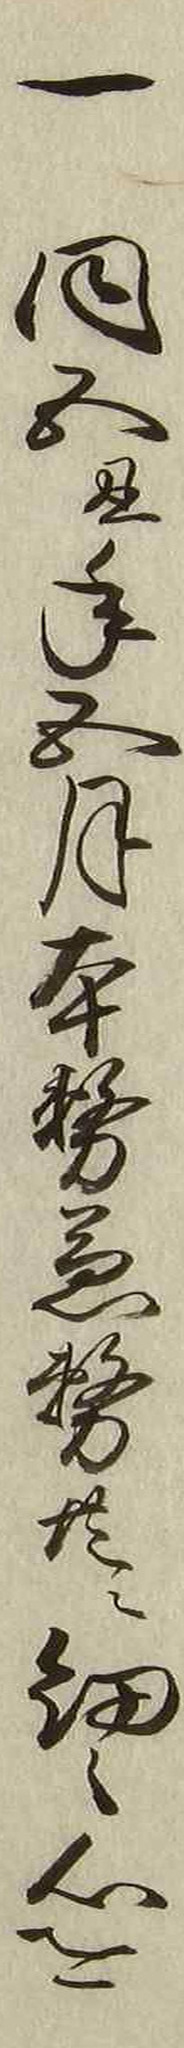一同五丑年五月本務兼務共ニ細々心を
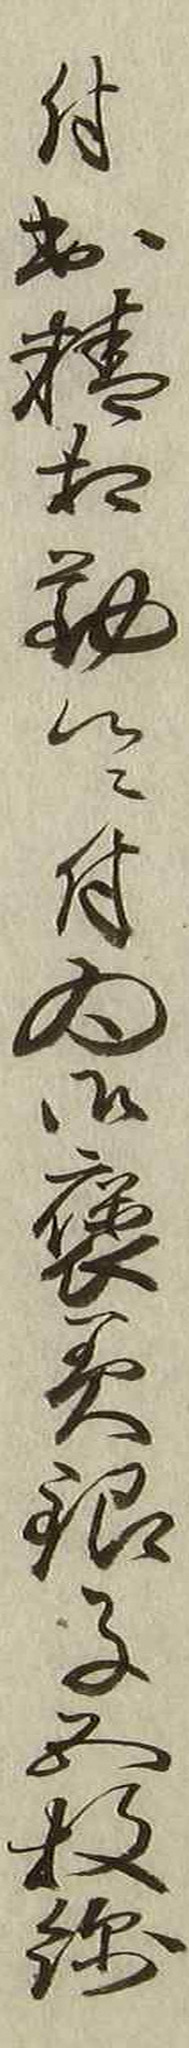付出精相勤候ニ付為御褒美銀子五枚綿
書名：諸士系譜　巻之21　い之部21
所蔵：会津若松市立会津図書館
